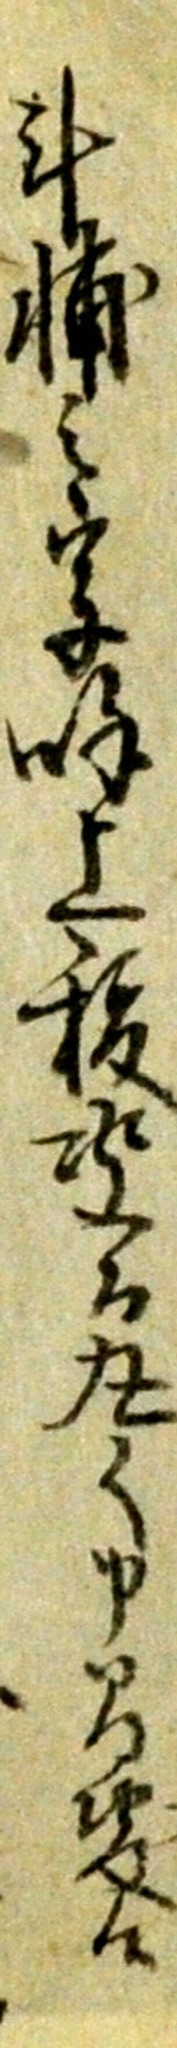斗輔之字呼上抜決而丸く申間敷候
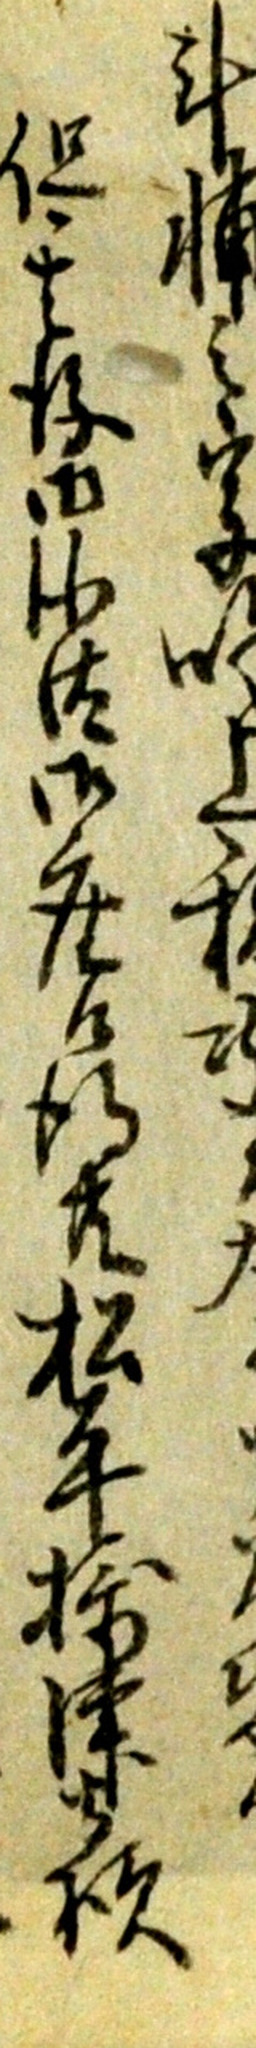但其存御沙汰御座候得共松平摂津守様
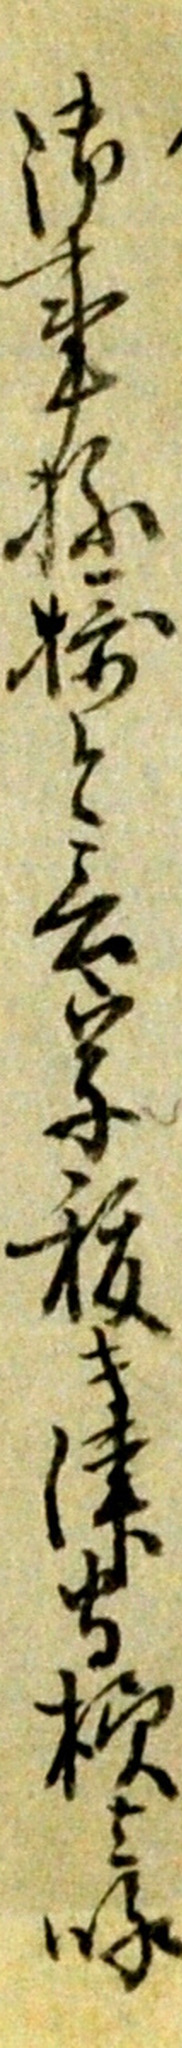御事抔摂と言字抜キ津守様と呼
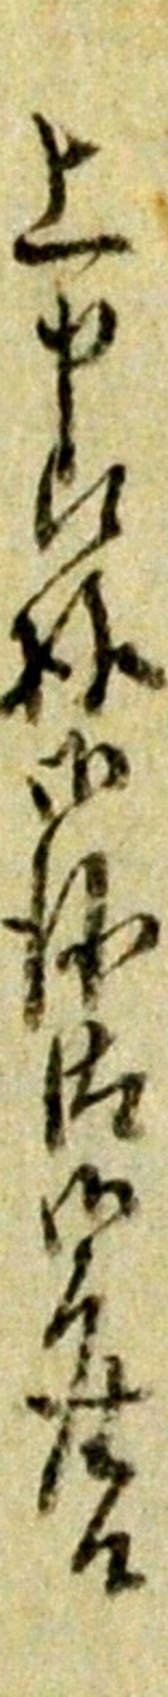上申候様御沙汰御座候
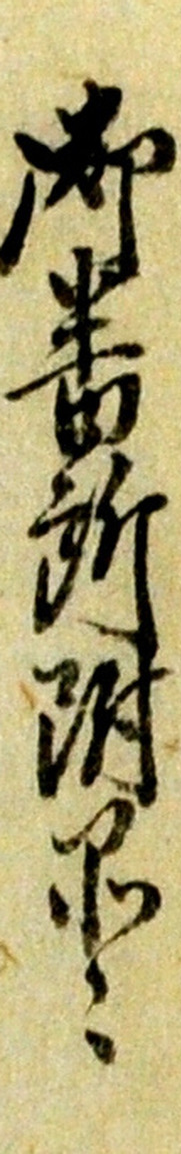御番所附品々
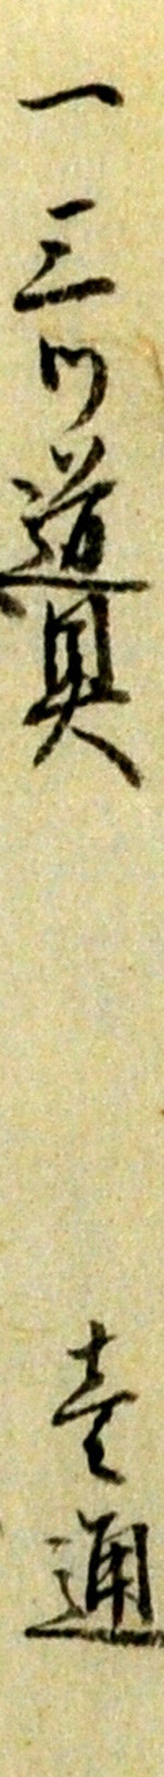一三ツ道具壱通
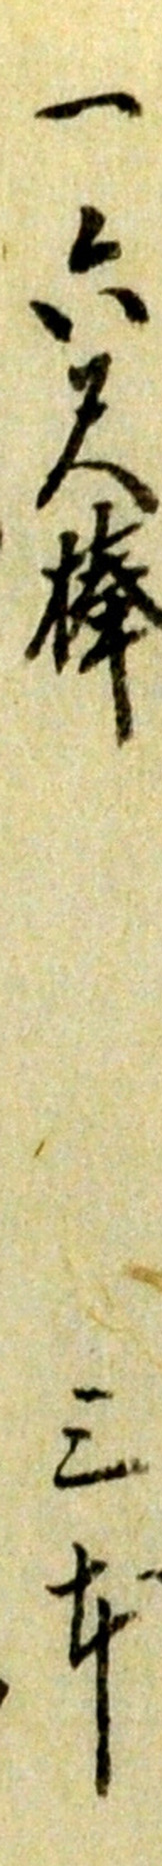一六尺棒三本
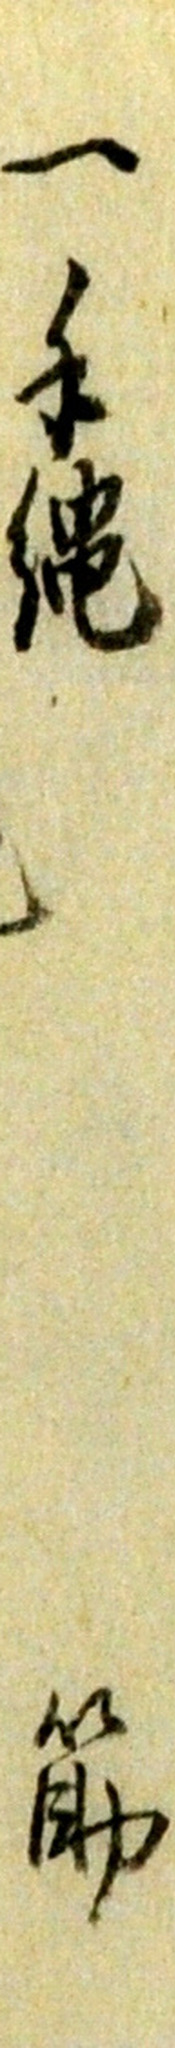一手縄筋
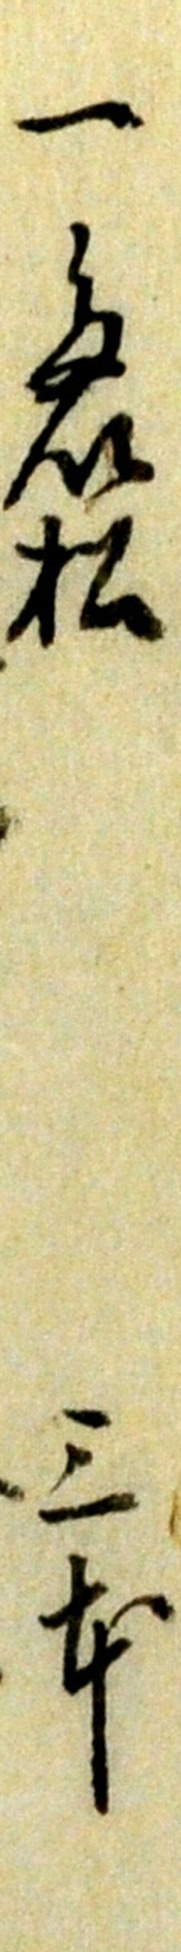一たい松三本
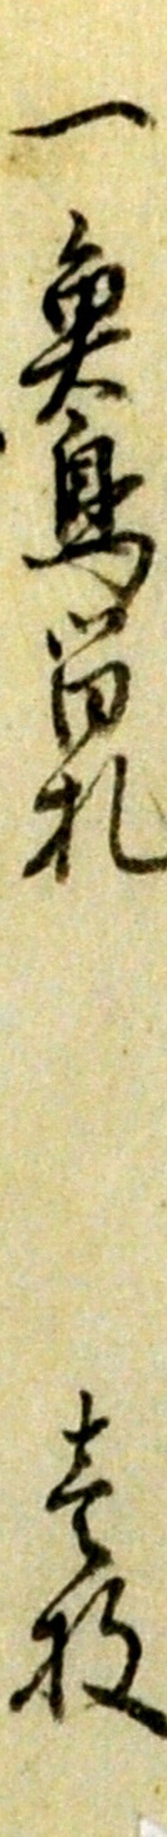一魚鳥留札壱枚
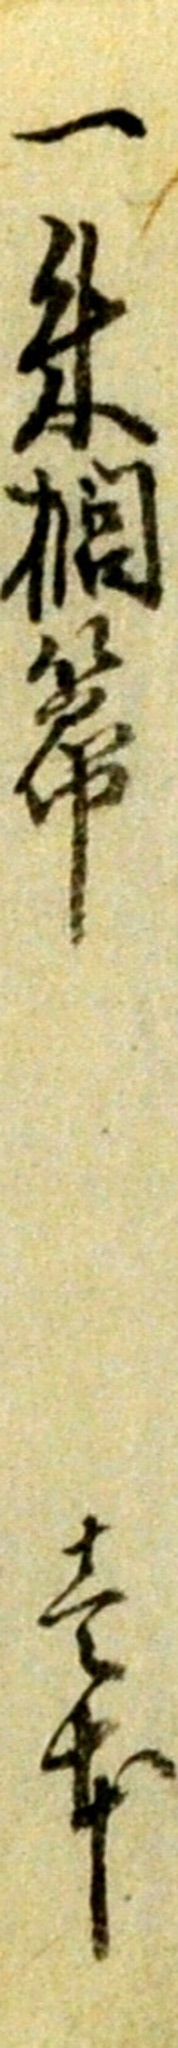一朱櫚箒壱本
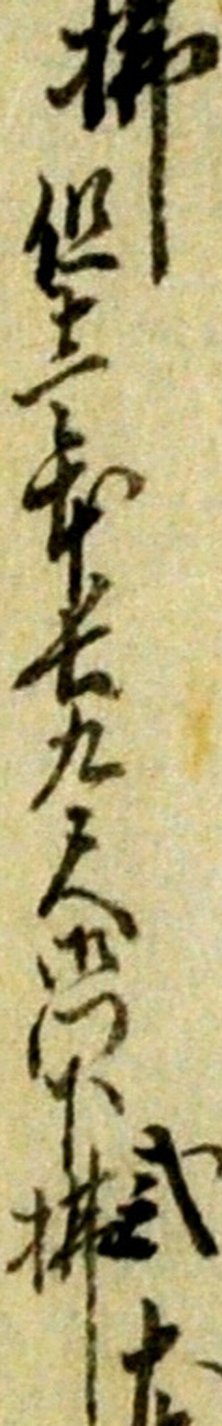但壱本長九尺御門下払
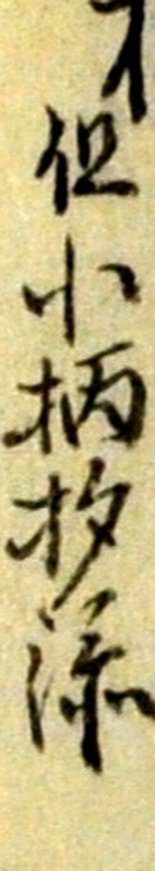但小柄柄添

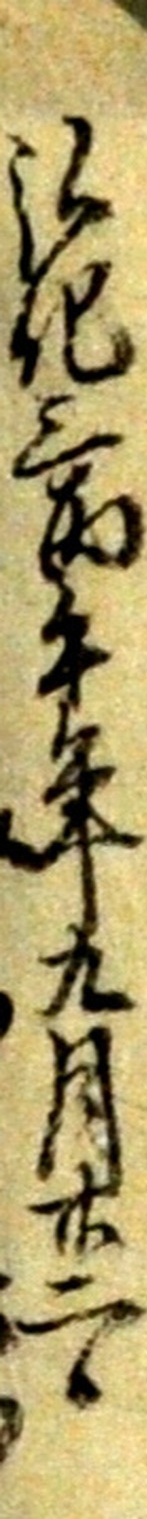弘化三丙午年九月廿ニ日
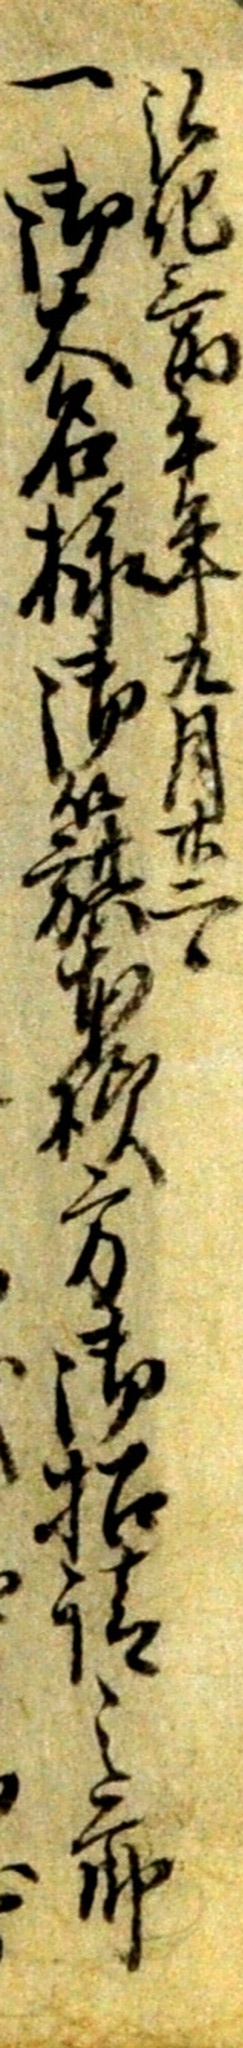一御大名様御籏本様方御招請之節
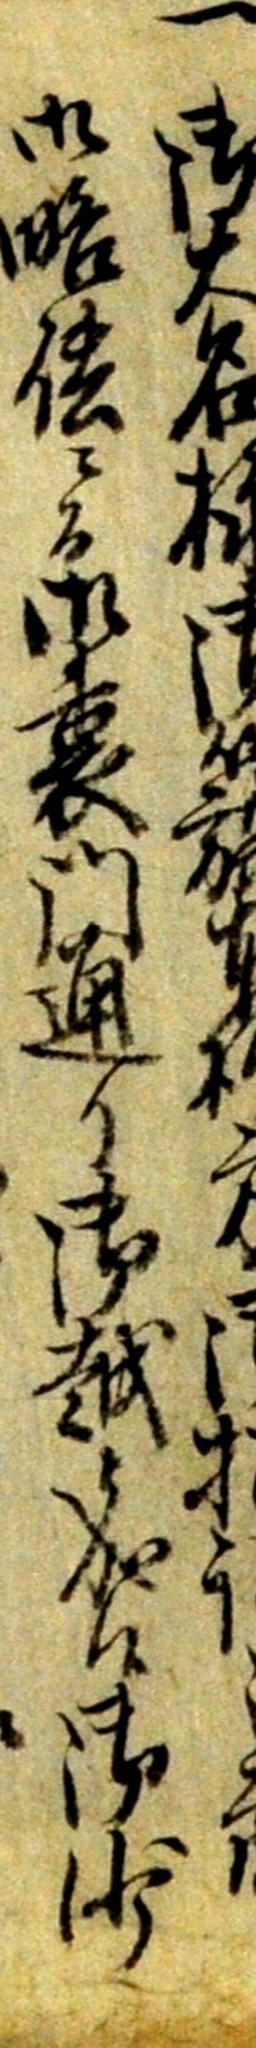御略供ニ而御裏門通り御越被成候御沙
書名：御先手組江戸御屋敷御門番勤方
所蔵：伊那市立高遠町図書館・合同会社AMANE
